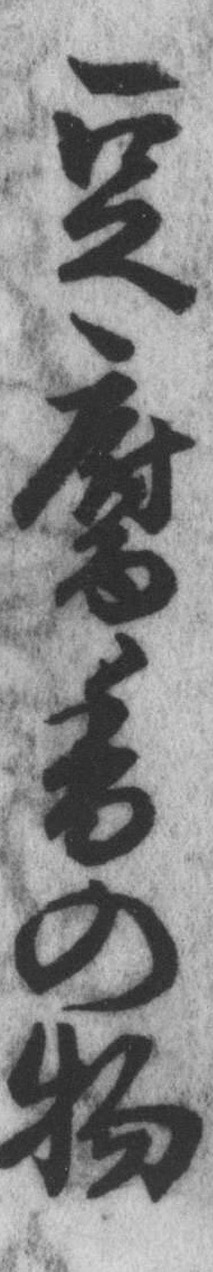豆腐香の物
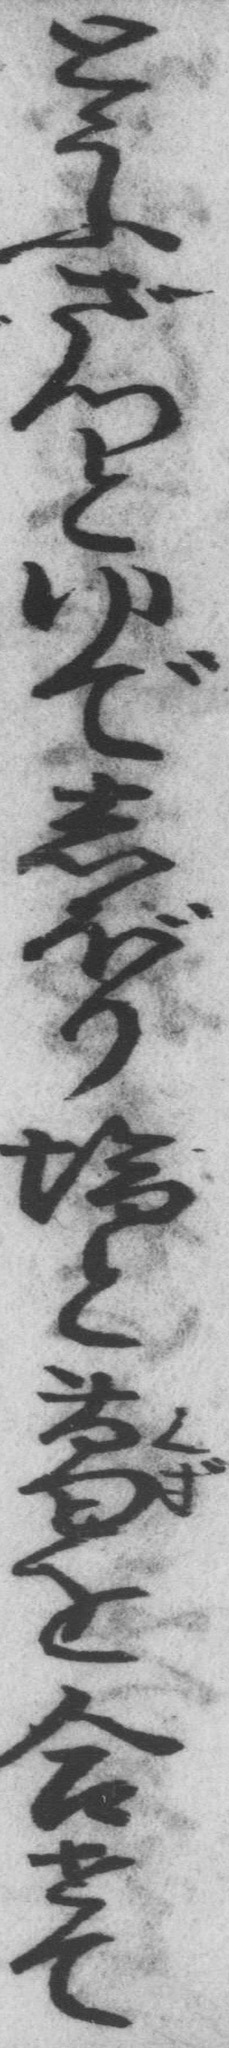とうふざつとゆでしぼり塩と葛を合せて
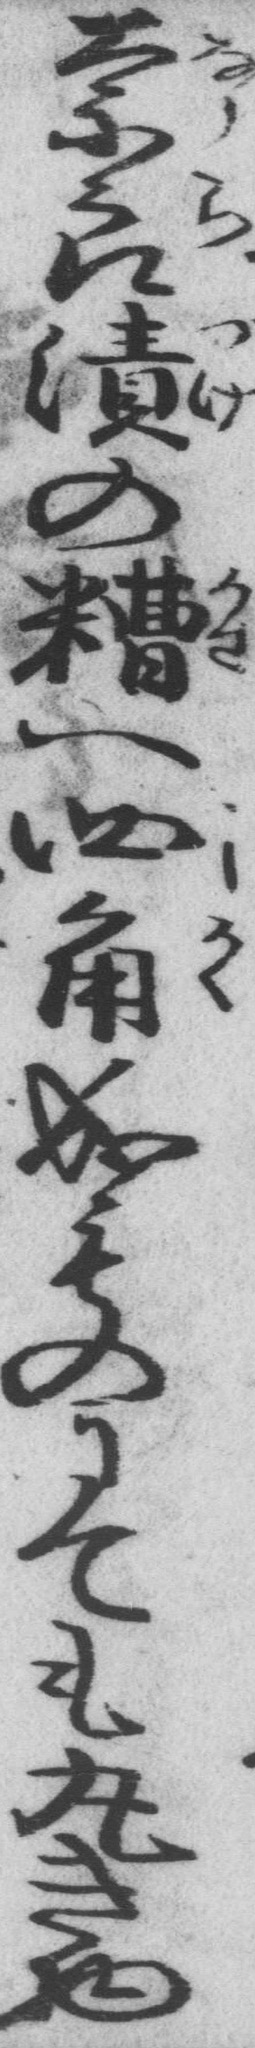奈良漬の糟へ四角成ものにても丸き物
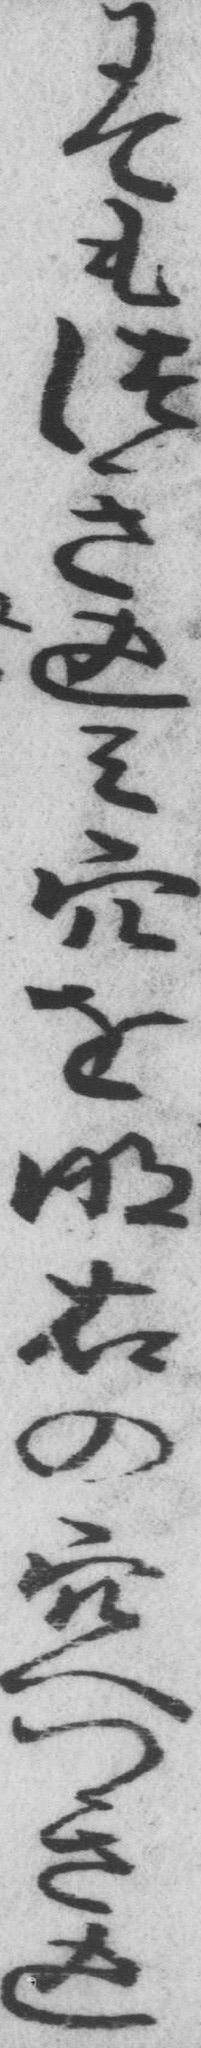にてもつき込み穴を明右の穴へつき込
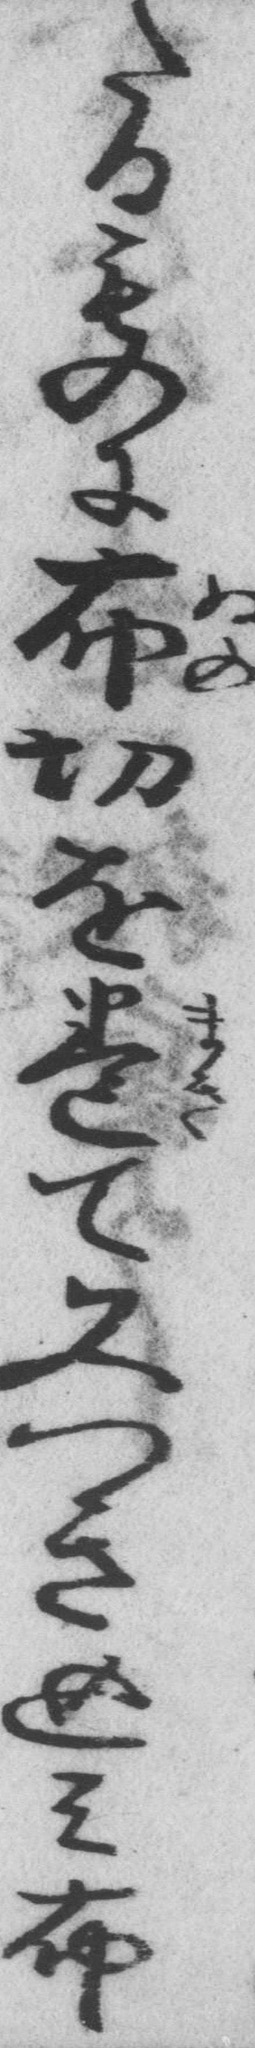たるものに布切を巻て又つき込み布
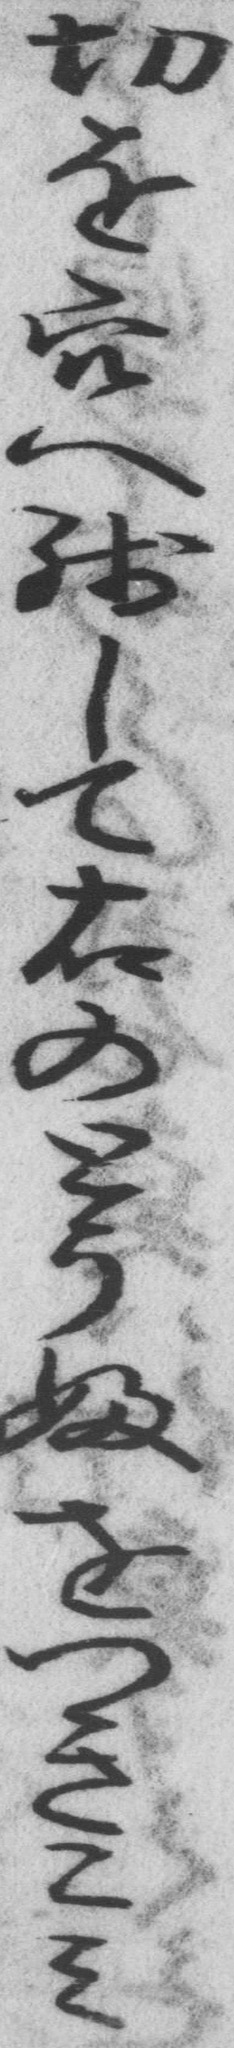切を穴へ残して右のとうふをつきこみ
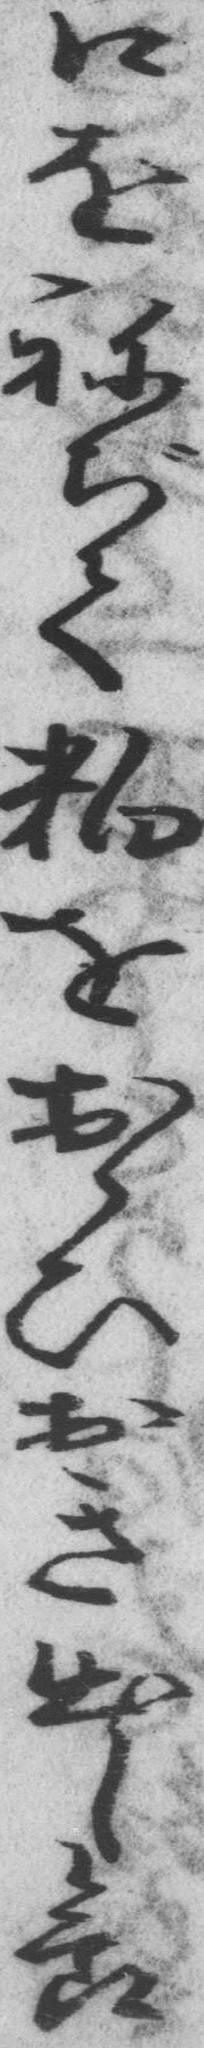口をねぢて粕をおゝひおき出し候節
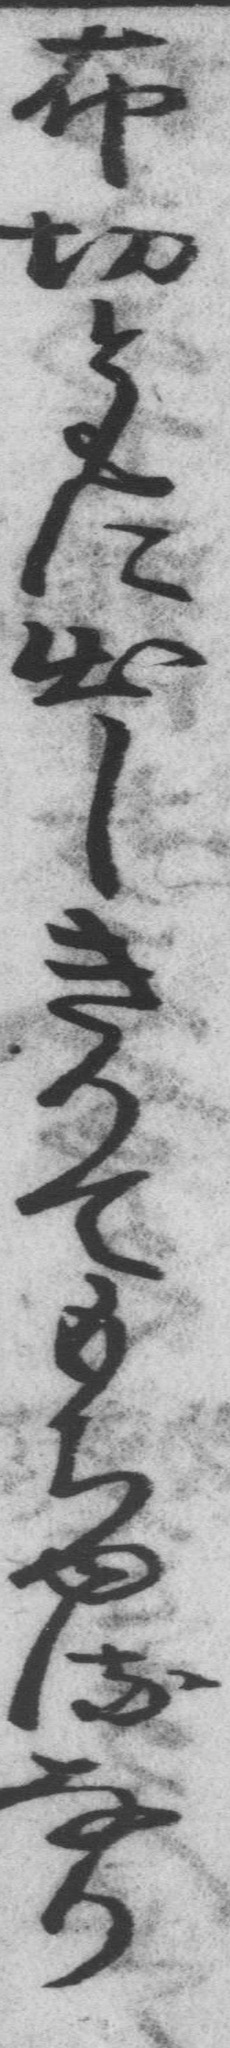布切ともに出しきりてもちゆるなり
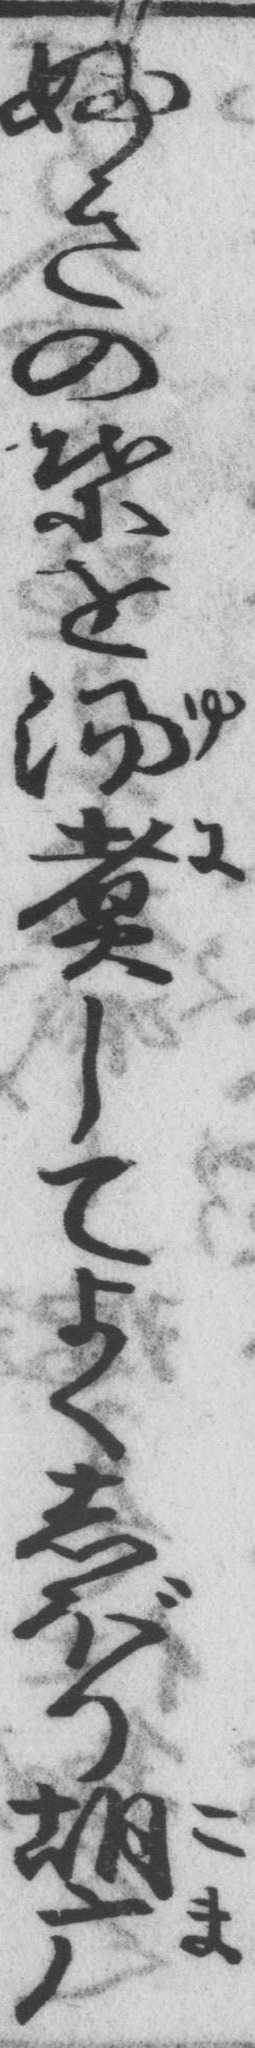ふきの葉を湯煮してよくしぼり胡麻
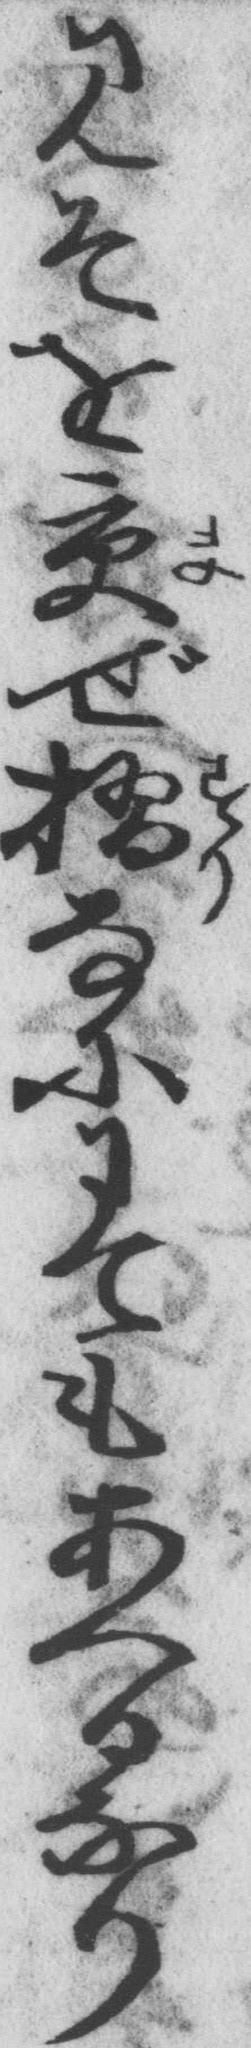みそを交ぜ摺なににてもあへるなり
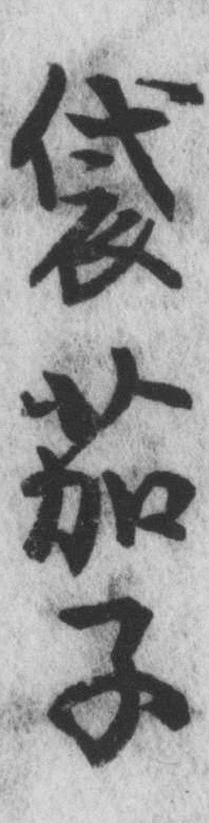袋茄子
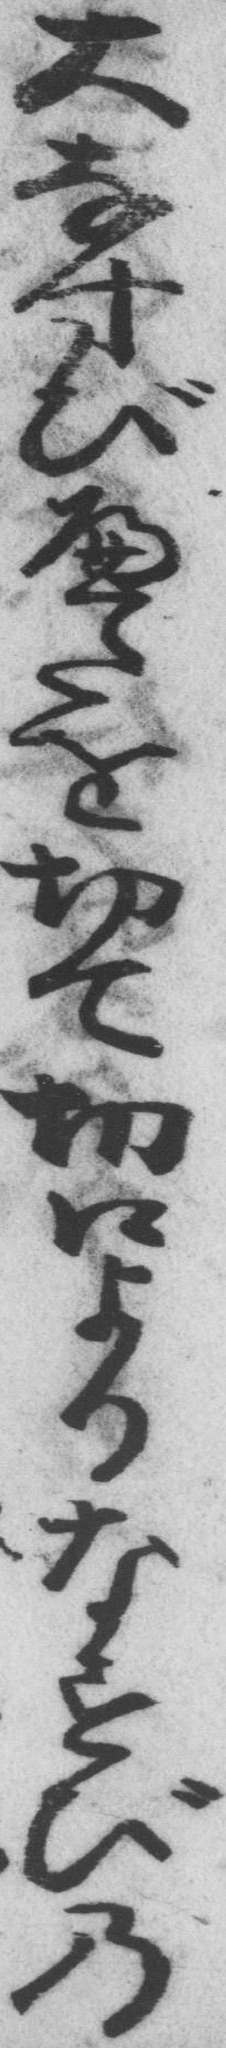大なすびへたを切て切口よりなすびの
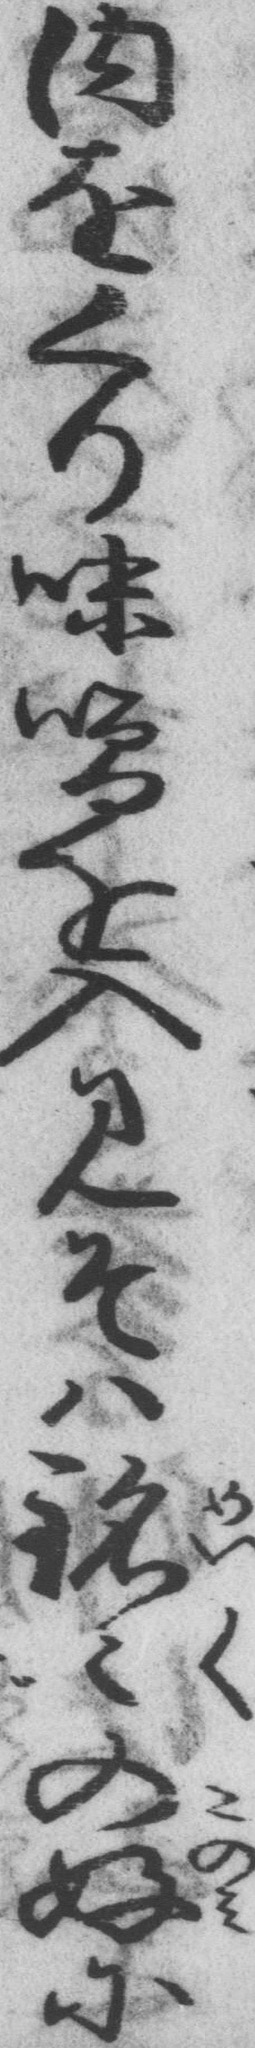内をくり味噌を入みそは銘々の好に
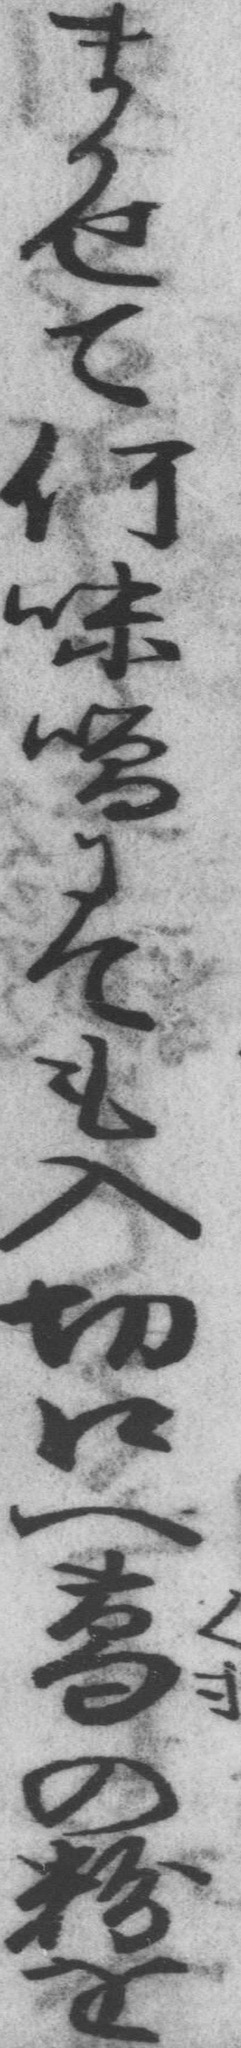まかせて何味噌にても入切口へ葛の粉を

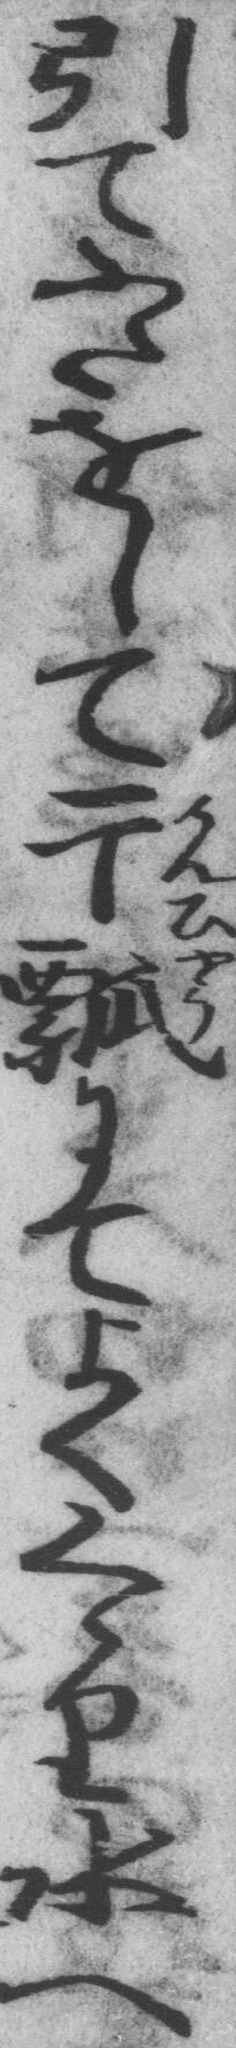引てふたをして干瓢にてよくくゝり水へ
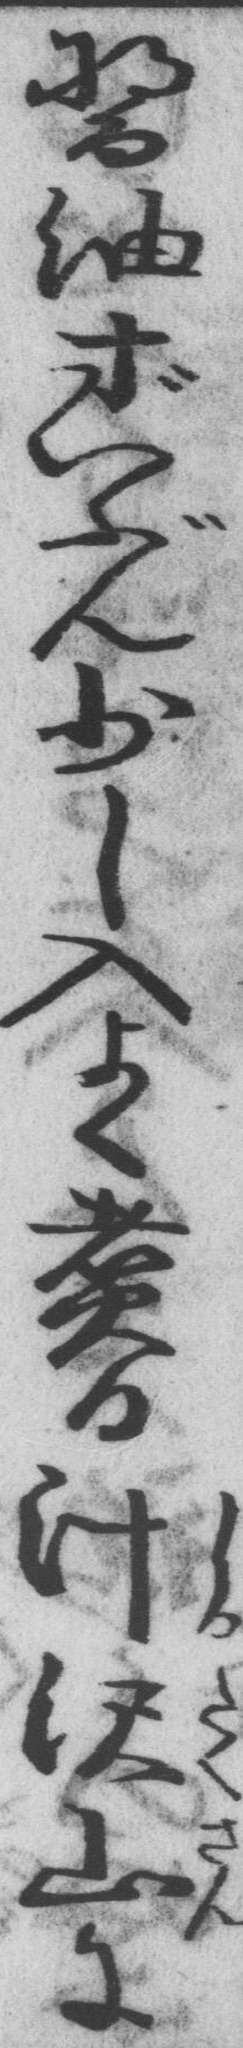醤油ずいぶん少し入よく煮る汁沢山に
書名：料理山海郷
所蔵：大阪府立大学学術情報センター 国文学研究資料館
